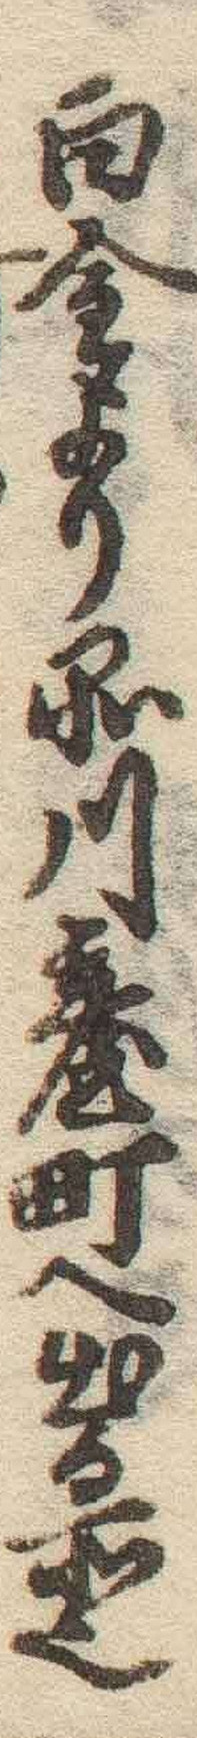白金より品川台町へ出る所也
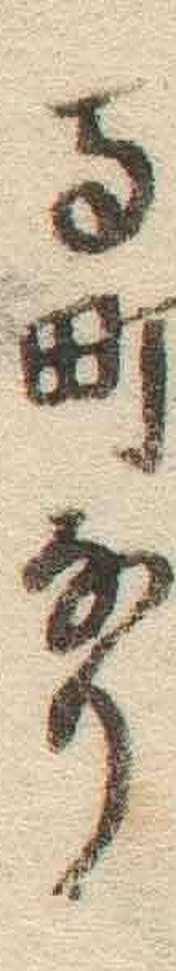寺町なり
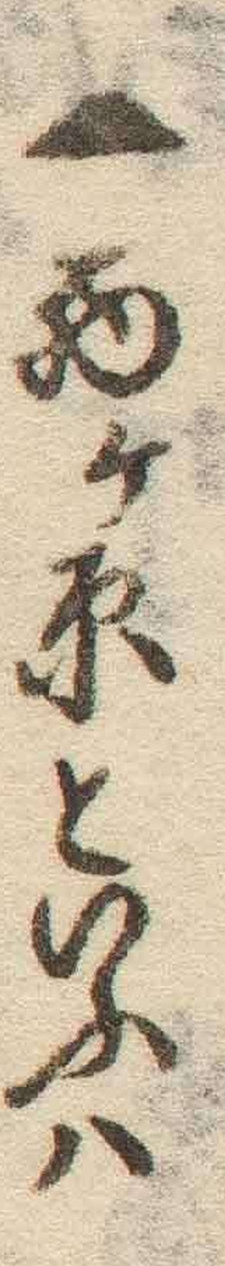▲西ヶ原といふは
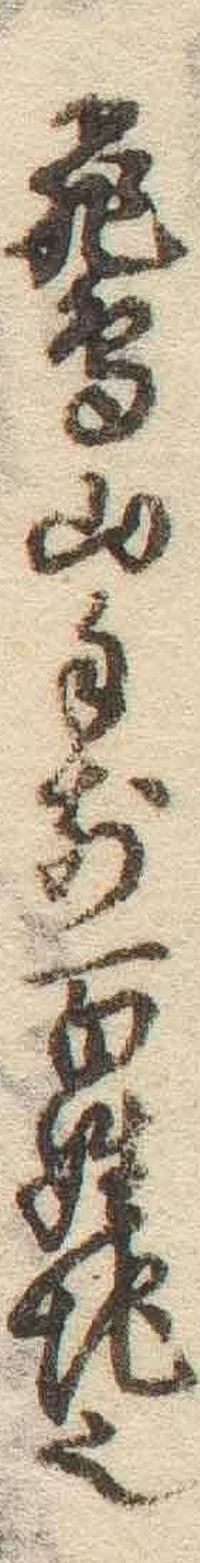飛鳥山手前百姓地也
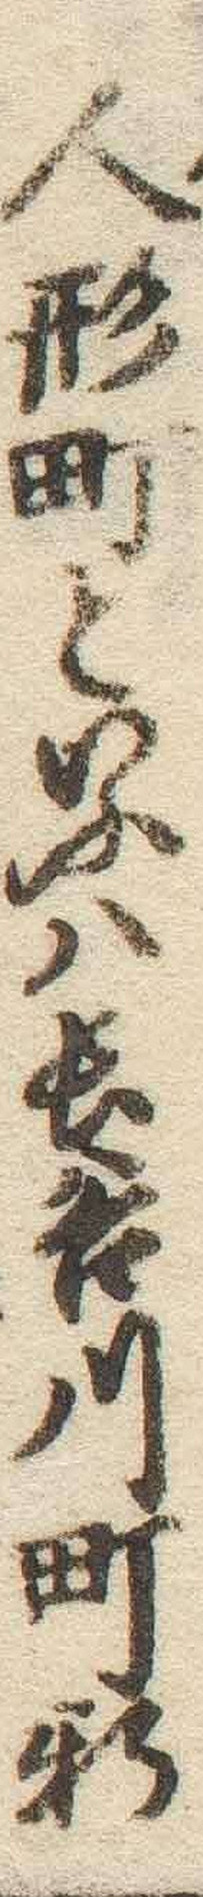人形町といふは長谷川町新
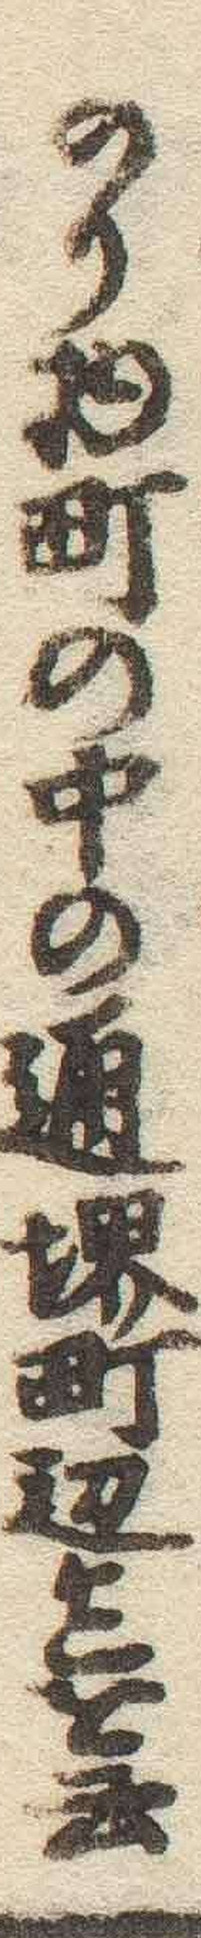のり物町の中の通堺町辺迄を云
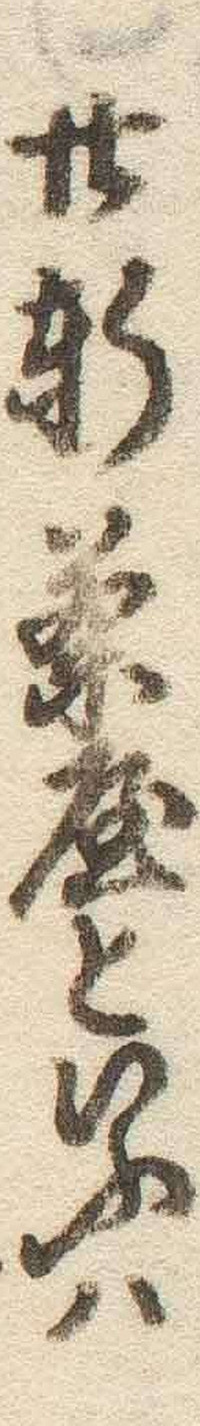廿軒茶屋といふは
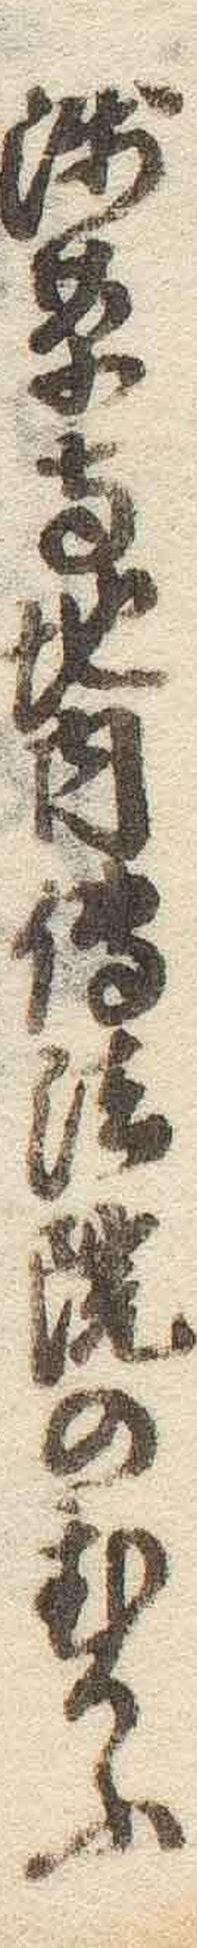浅草寺地内伝法院のむかふ
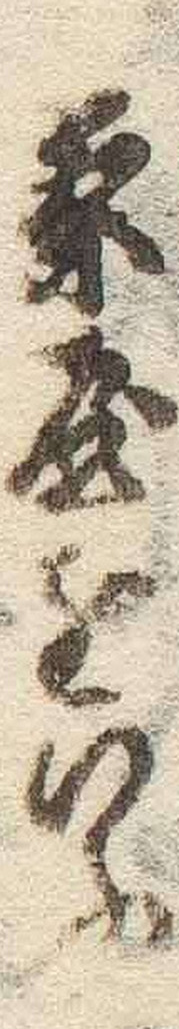茶屋をいふ
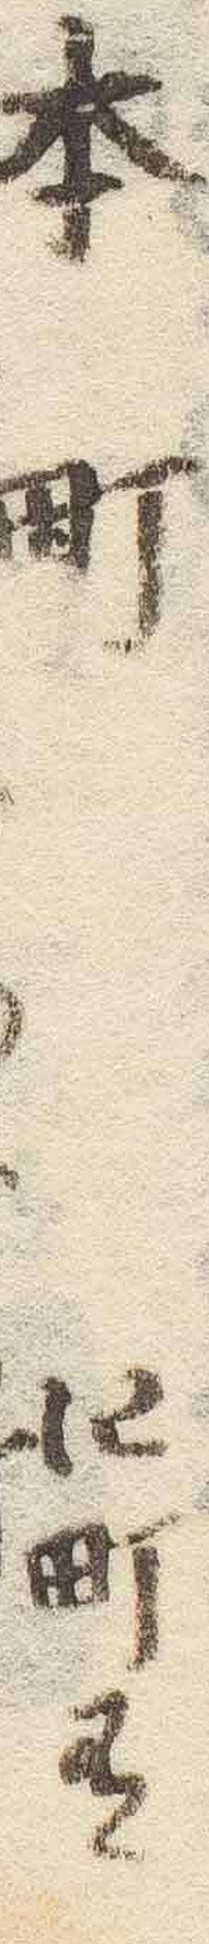本町四町有
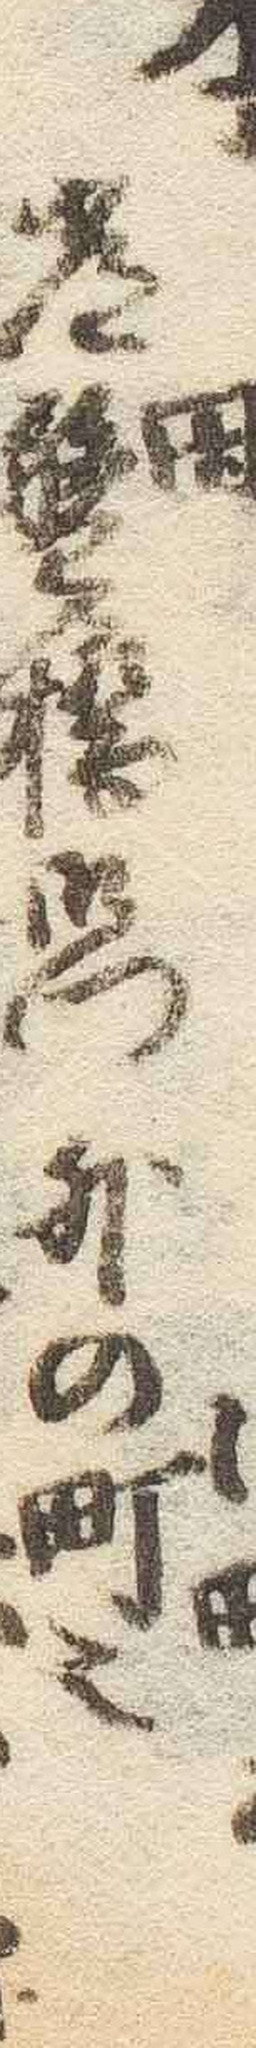常盤橋御門外の町也
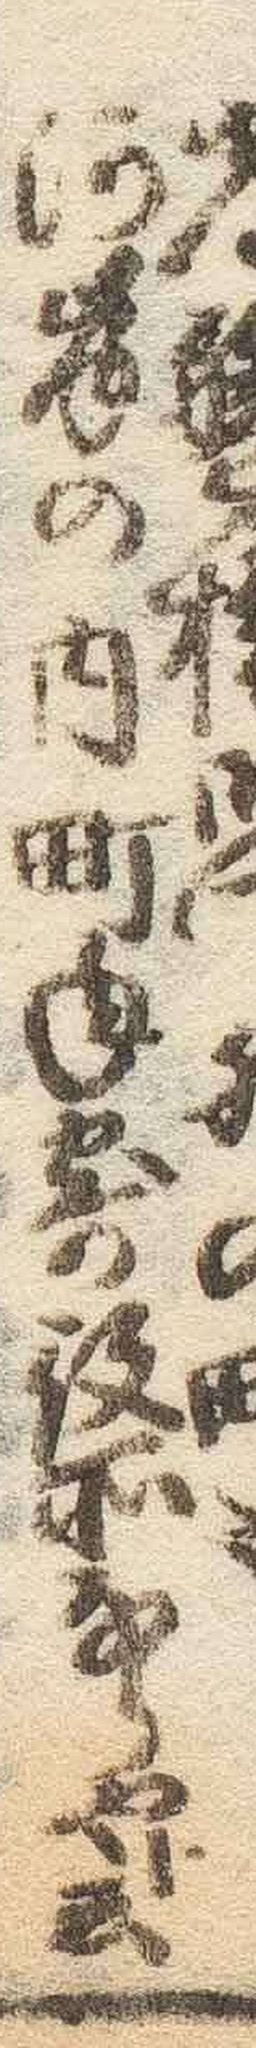河岸の内町年寄役所ならやと云
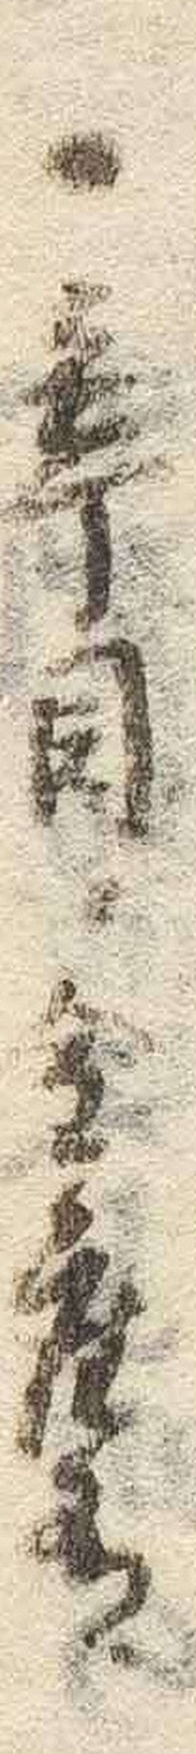・壱丁目に金座有
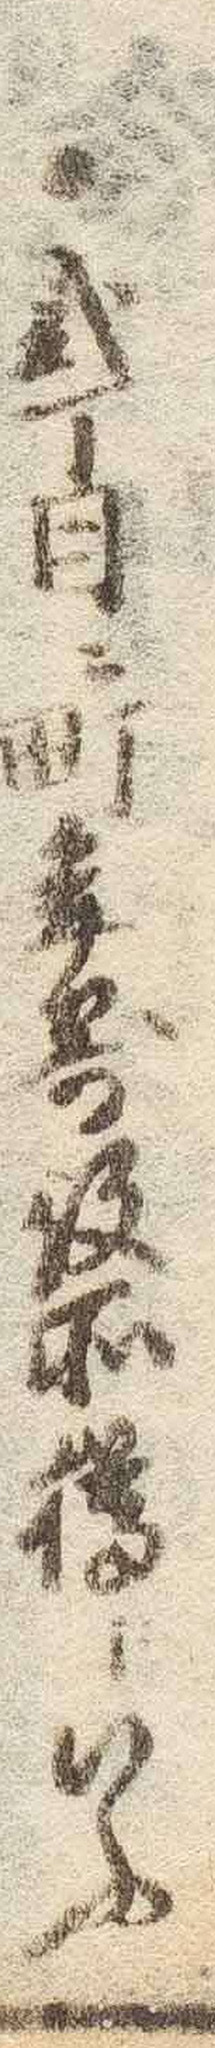・弐丁目に町年寄役所樽といふ
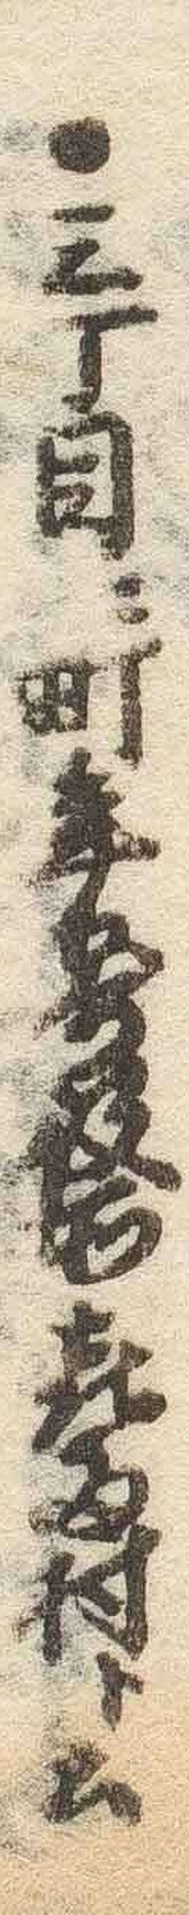・三丁目に町年寄役所喜多村と云
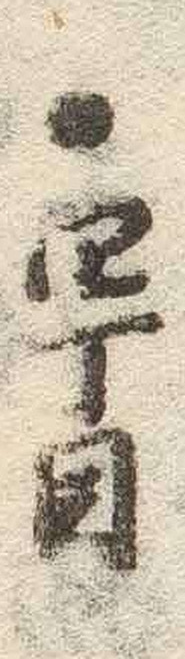・四丁目
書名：江戸町独案内
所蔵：東京学芸大学附属図書館 国文学研究資料館
